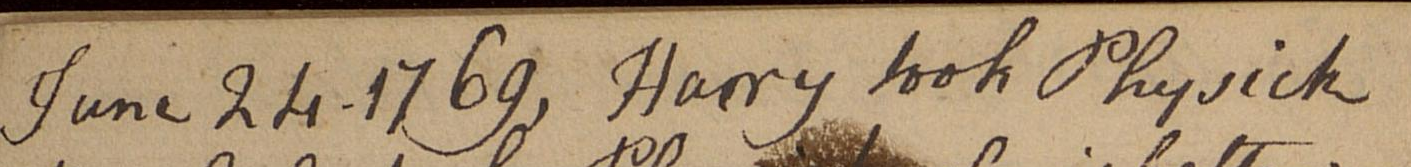June 24-1769, Harry took Physick
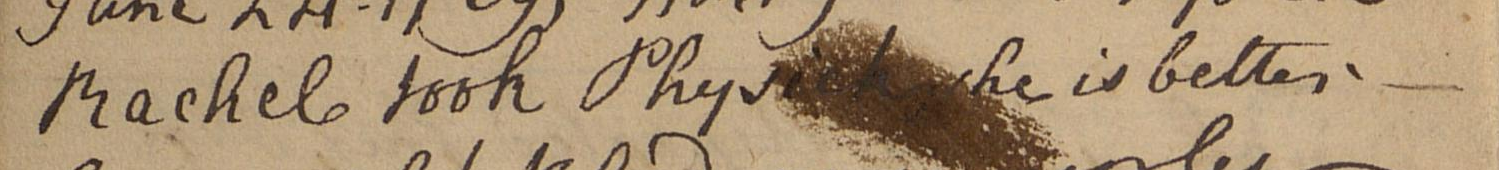Rachel took Physick she is better-
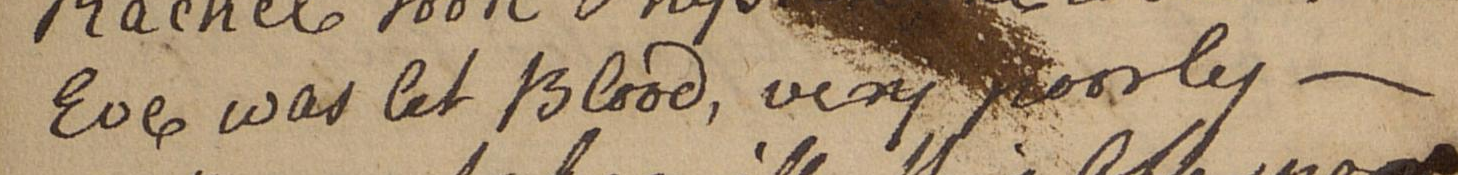Eve was let Blood, very poorly-
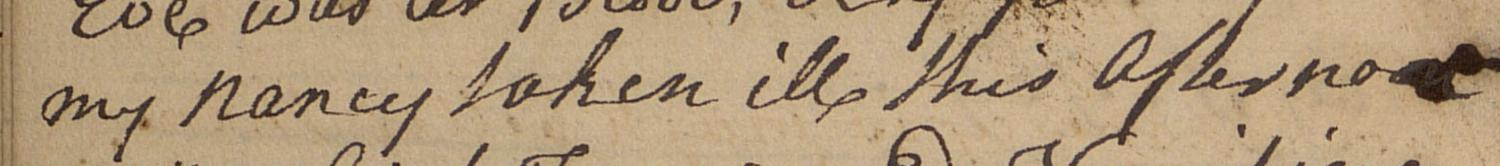my Nancy taken ill this Afterno[on]
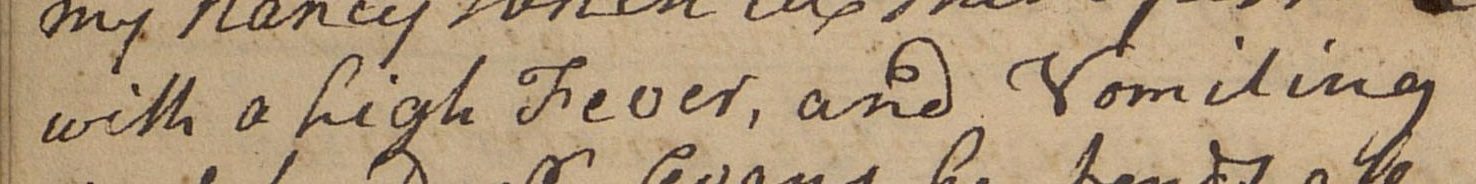with a high Fever, and Vomiting
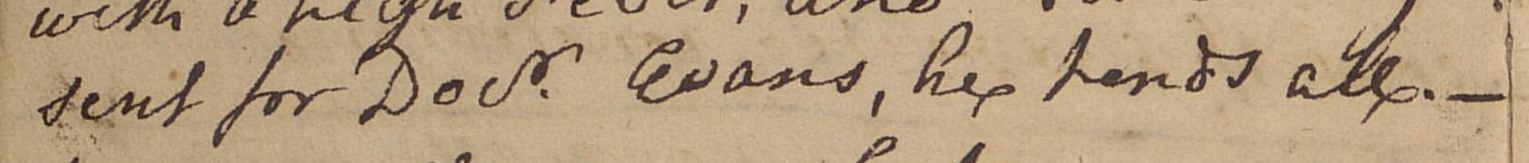sent for Doc^r. Evans, he tends all.-
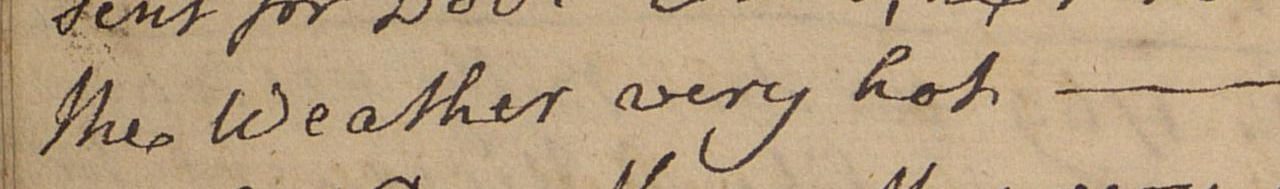the Weather very hot-
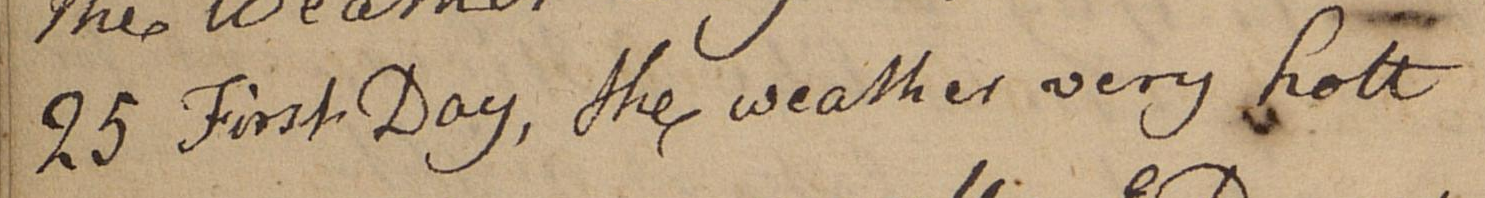25 First Day, the weather very hott
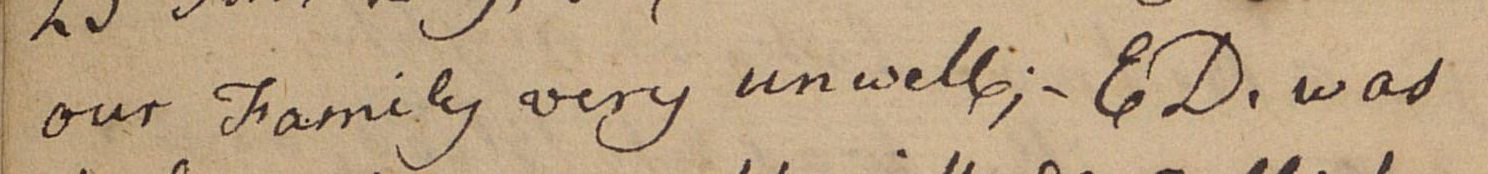our Family very unwell;- E D. was
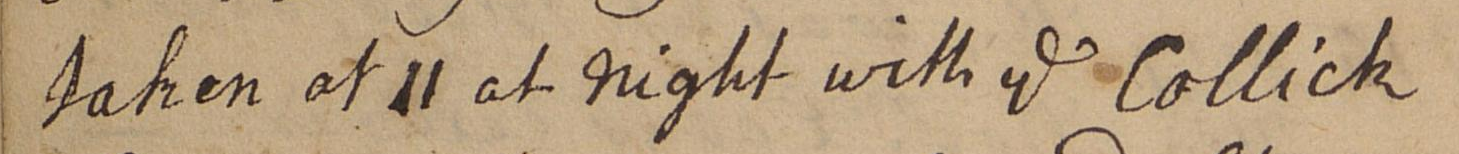taken at 11 at night with y^e Collick
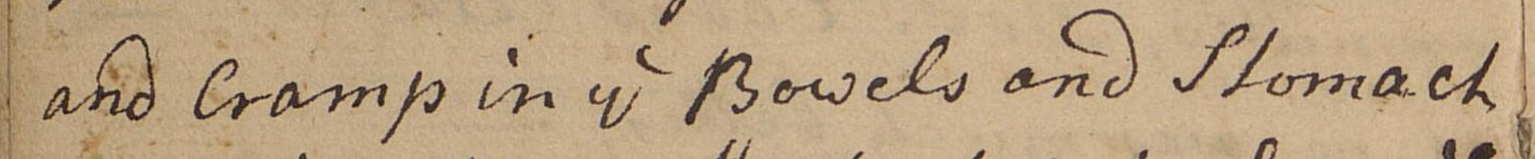and Cramp in y^e Bowels and Stomach
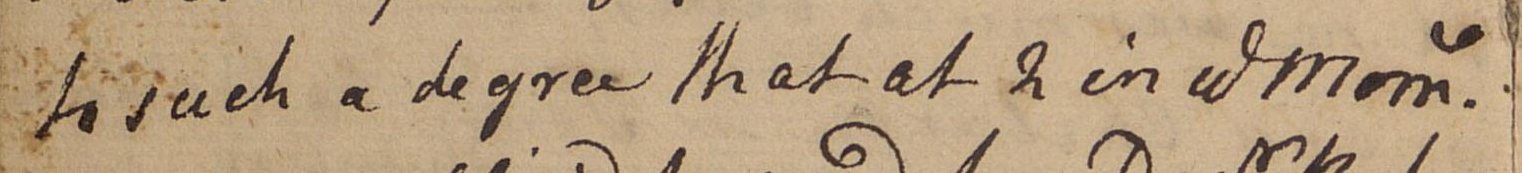to such a degree that at 2 in y^e Morn^g.
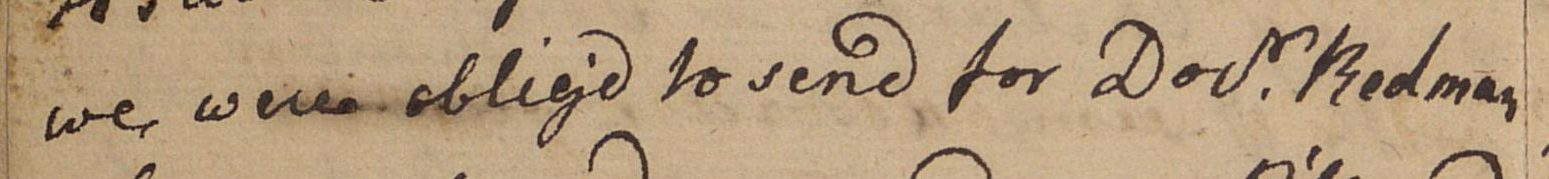we were oblig'd to send for Doc^r Redman
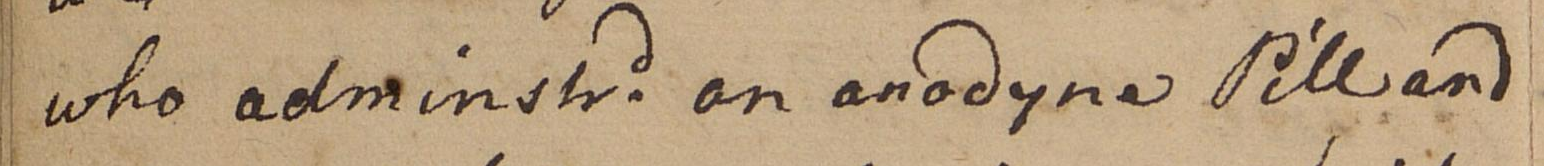who adminstr^d. an anodyne Pill and
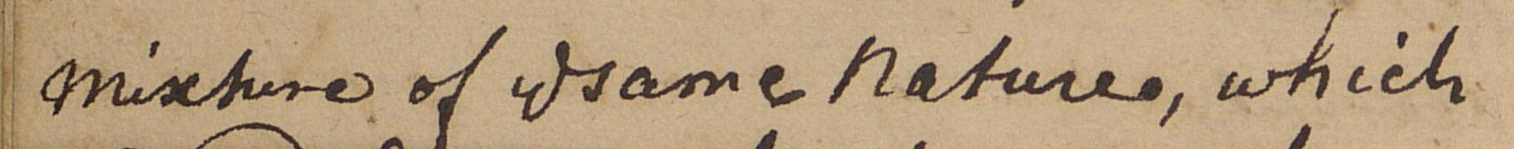mixture of y^e same Nature, which
